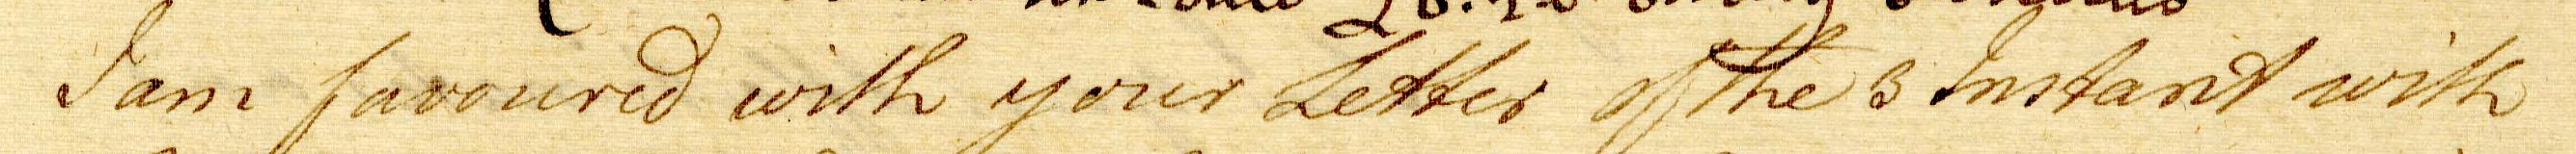I am favoured with your Letter of the 3 Instant with
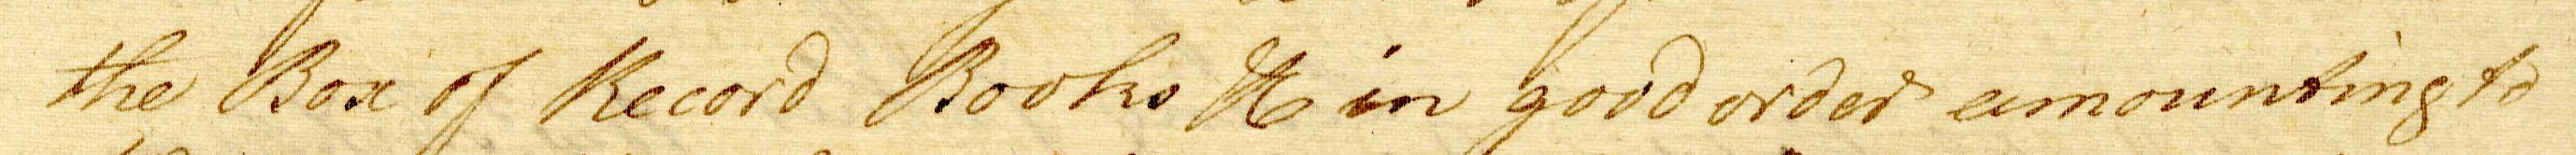the Box of Record Books &c in good order amounting to
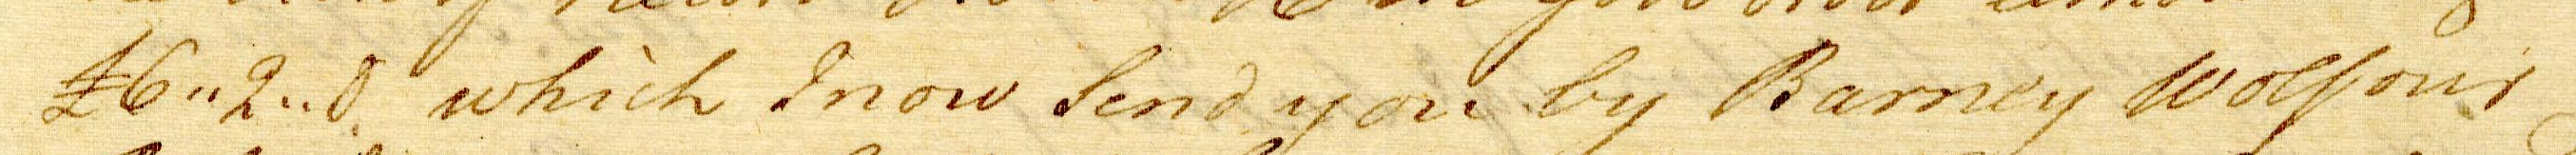£6..2..0, which I now send you by Barney Wolf our
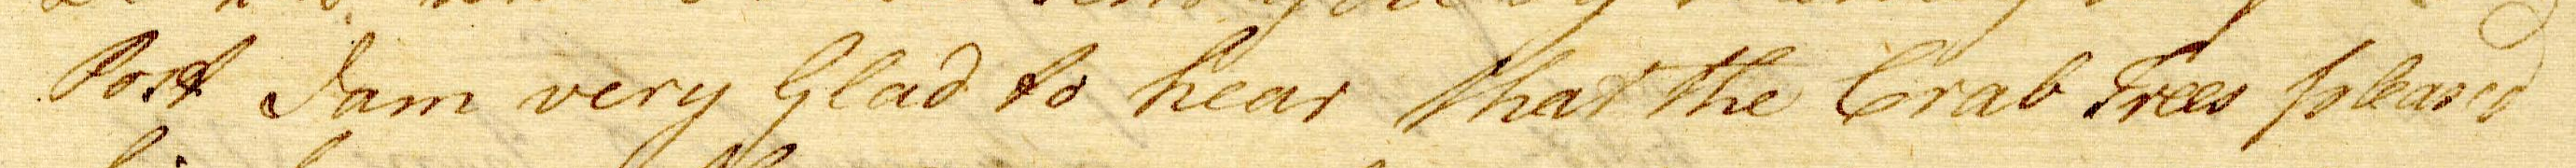Post I am very Glad to hear that the Crab Trees pleased
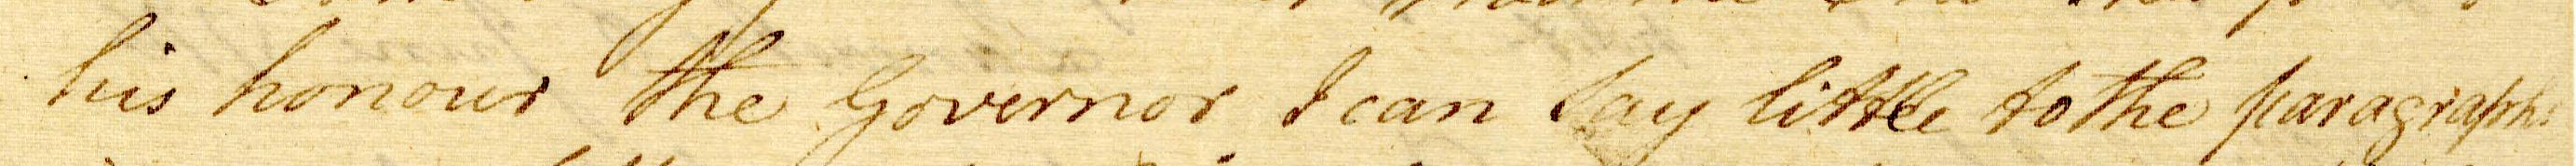his honour the Governor I can say little to the paragraphs
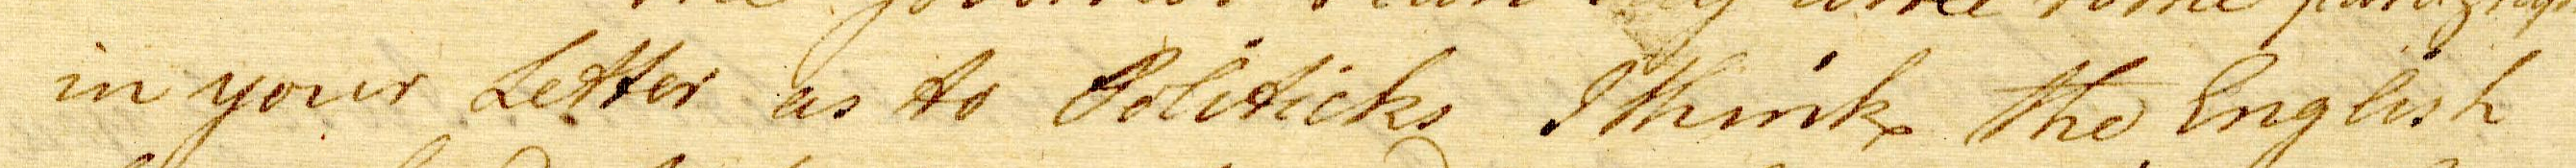in your Letter as to Politicks I think the English
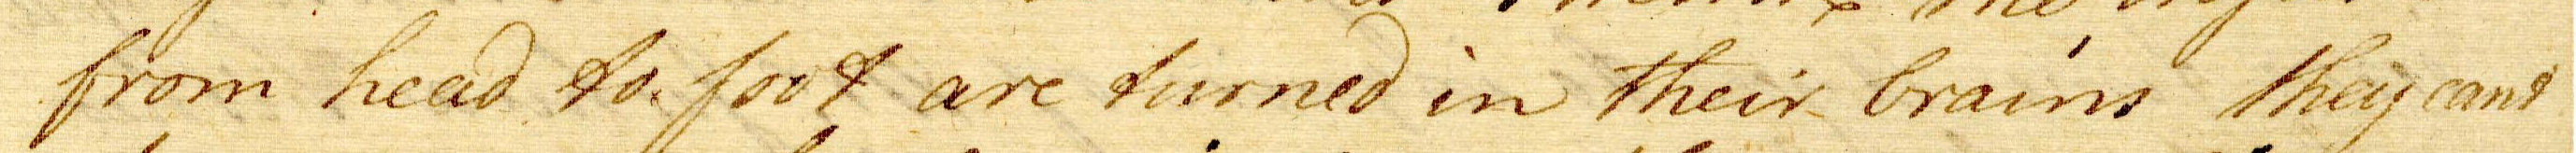from head to foot are turned in their brains they cant
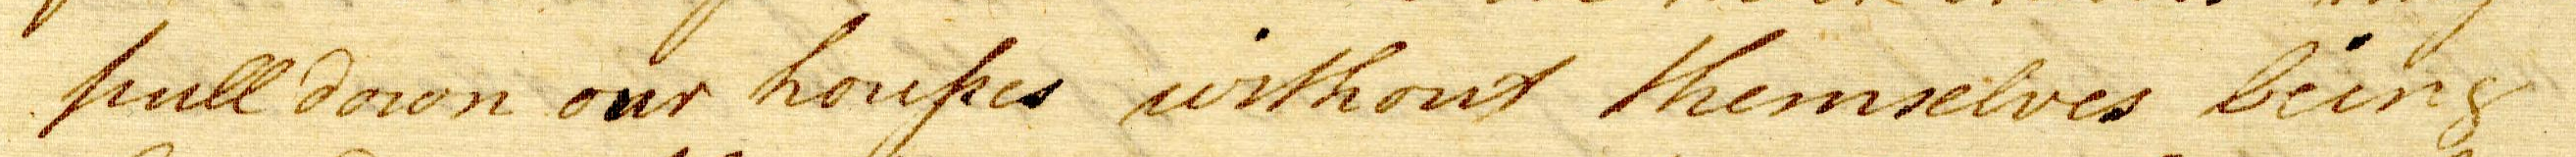pull down our houses without themselves being
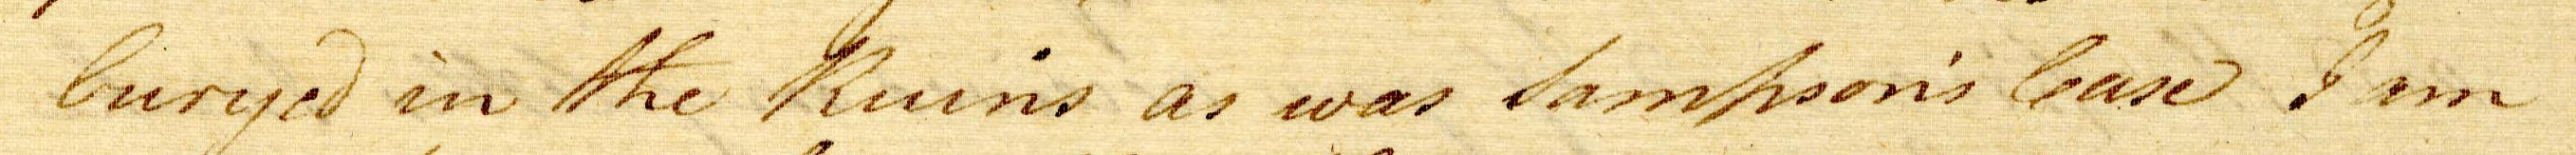buryed in the Ruins as was Sampson's Case I am
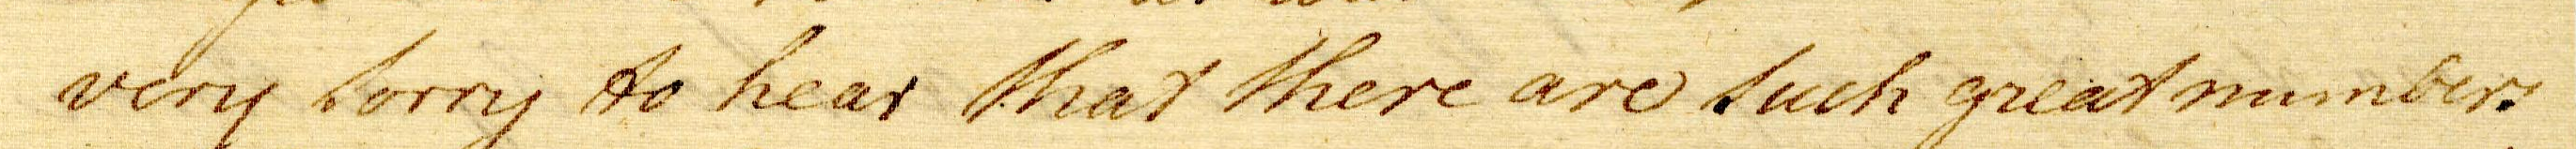very sorry to hear that there are such great numbers
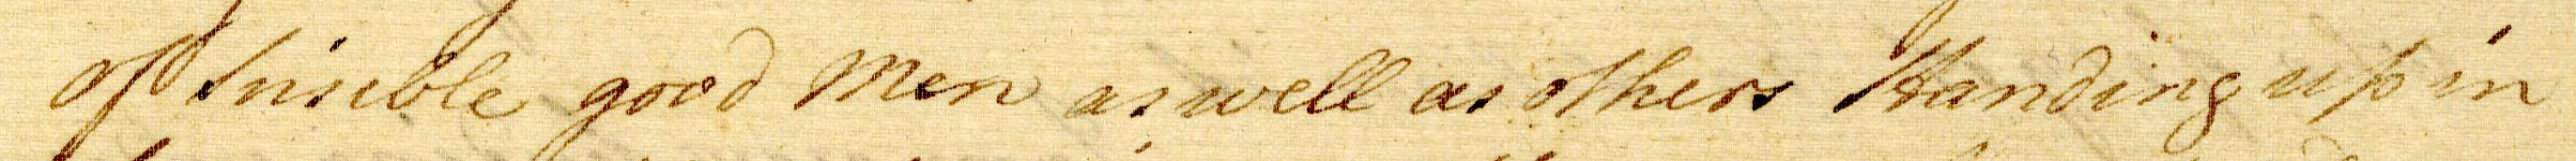of Insible good Men as well as others standing up in
